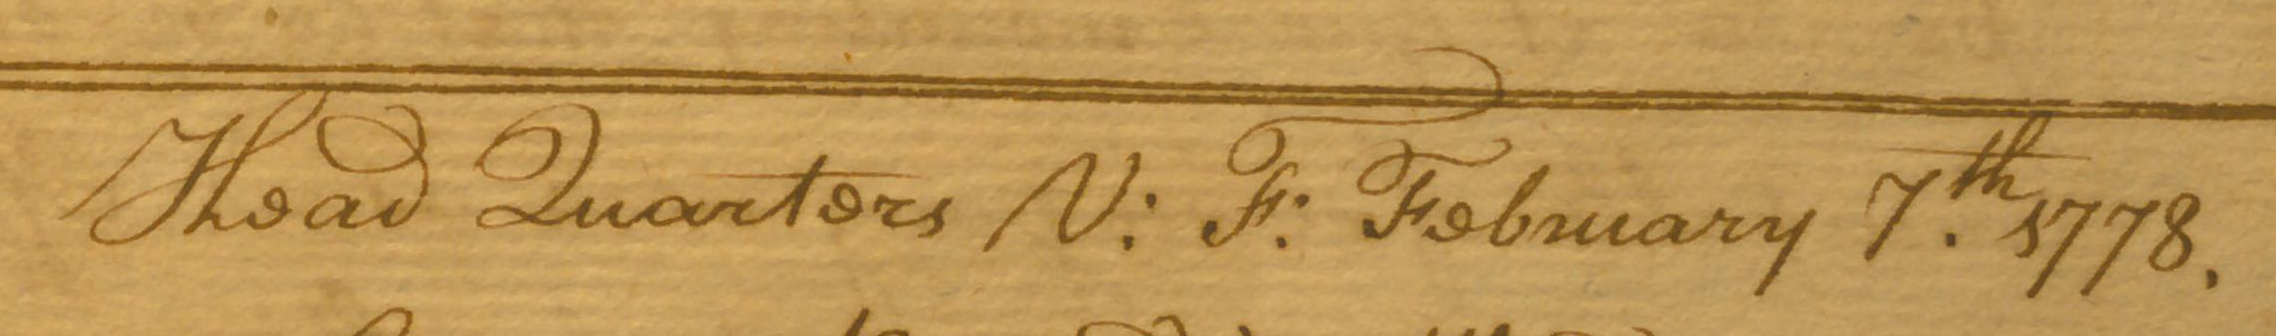Head Quarters V: F: February 7^th. 1778.
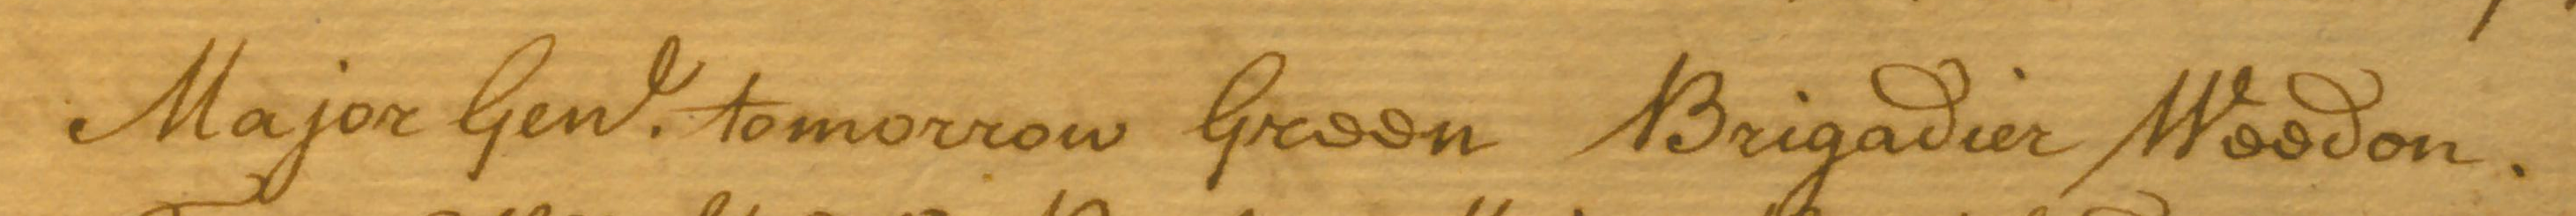Major Gen^l. tomorrow Green Brigadier Weedon.
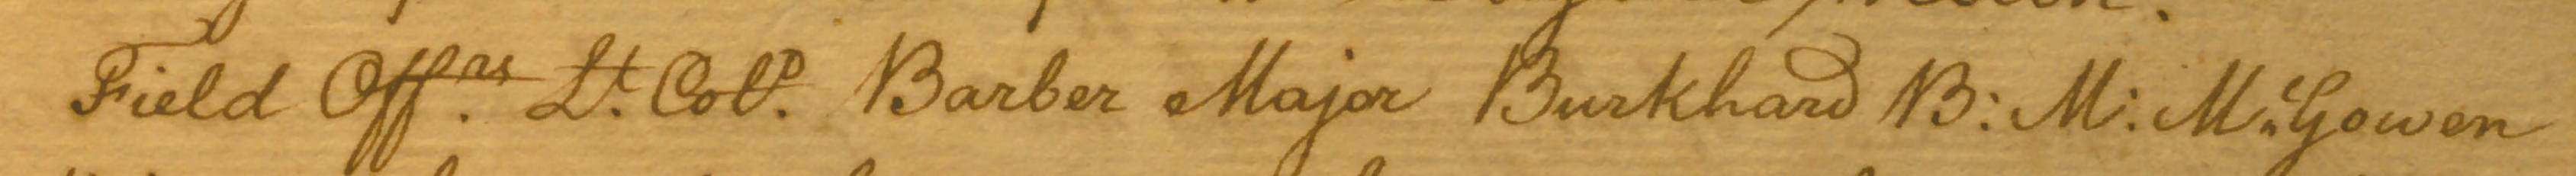Field Off^rs. L^t. Col^o. Barber Major Burkhard B: M: M^c.Gowen
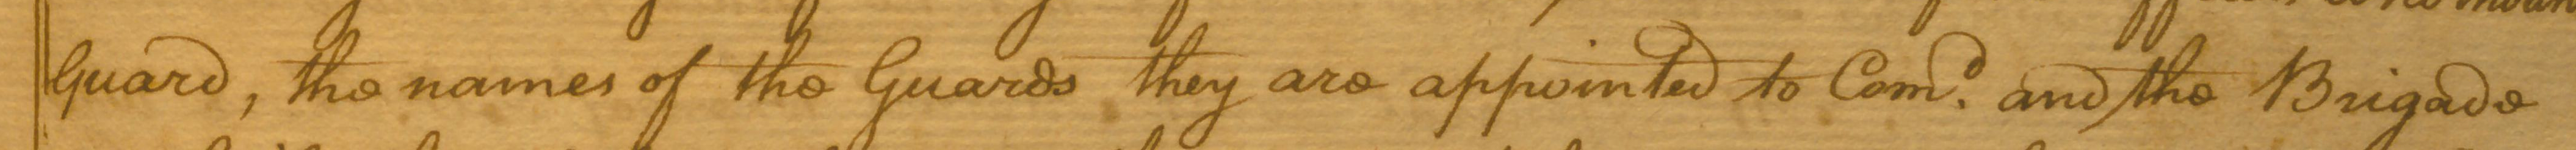Guard, the names of the Guards they are appointed to Com^d. and the Brigade
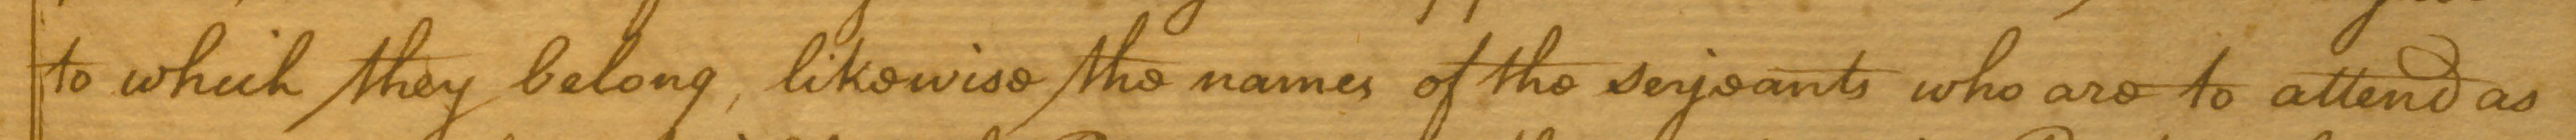to which they belong, likewise the names of the serjeants who are to attend as
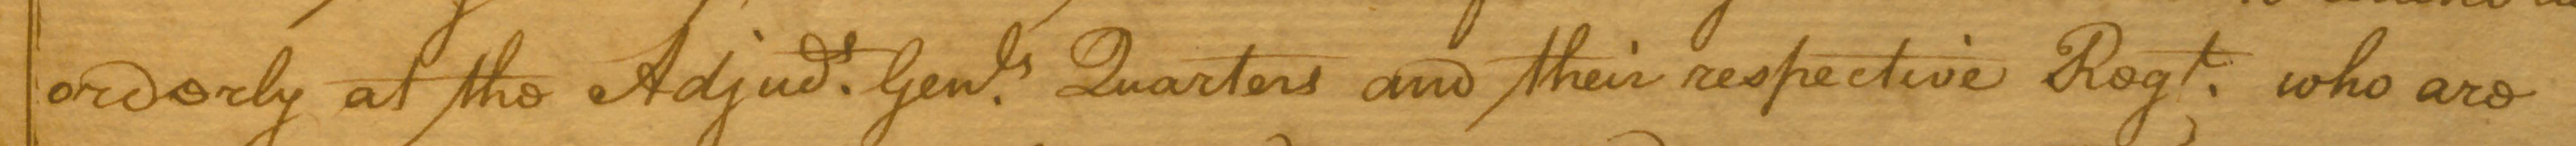orderly at the Adjud^t. Gen^ls. Quarters and their respective Reg^ts. who are
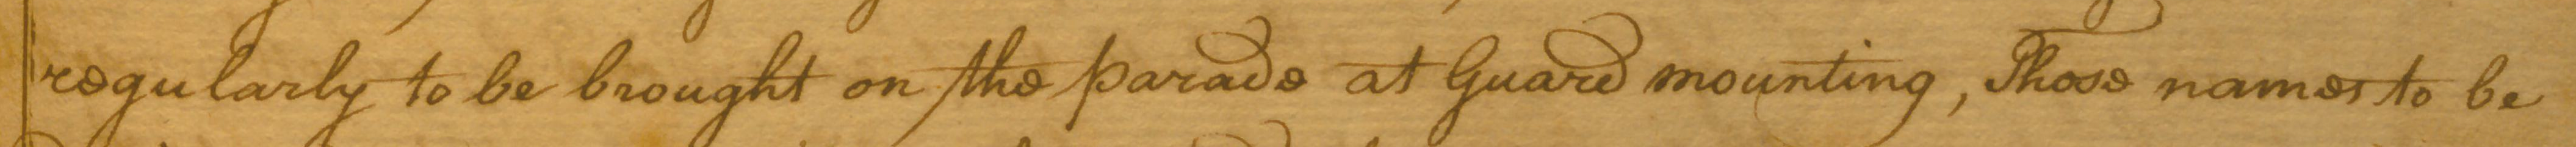regularly to be brought on the parade at Guard mounting, Those names to be
